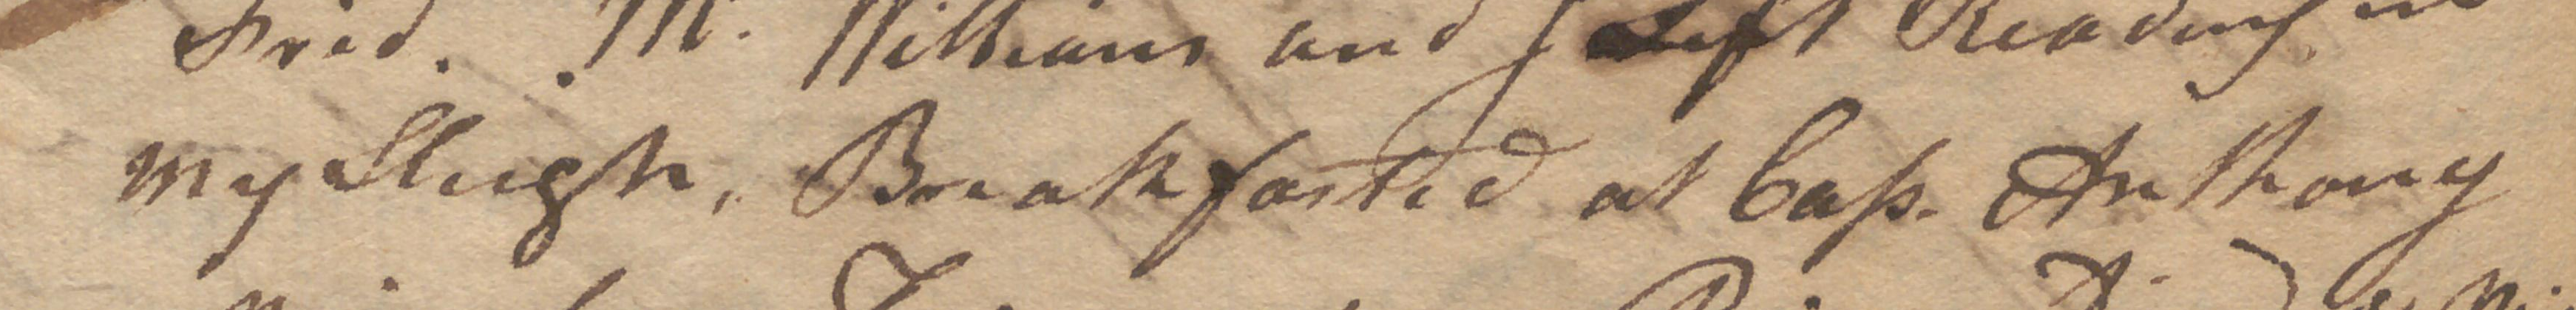my Sleigh, Breakfasted at Cap. Anthony
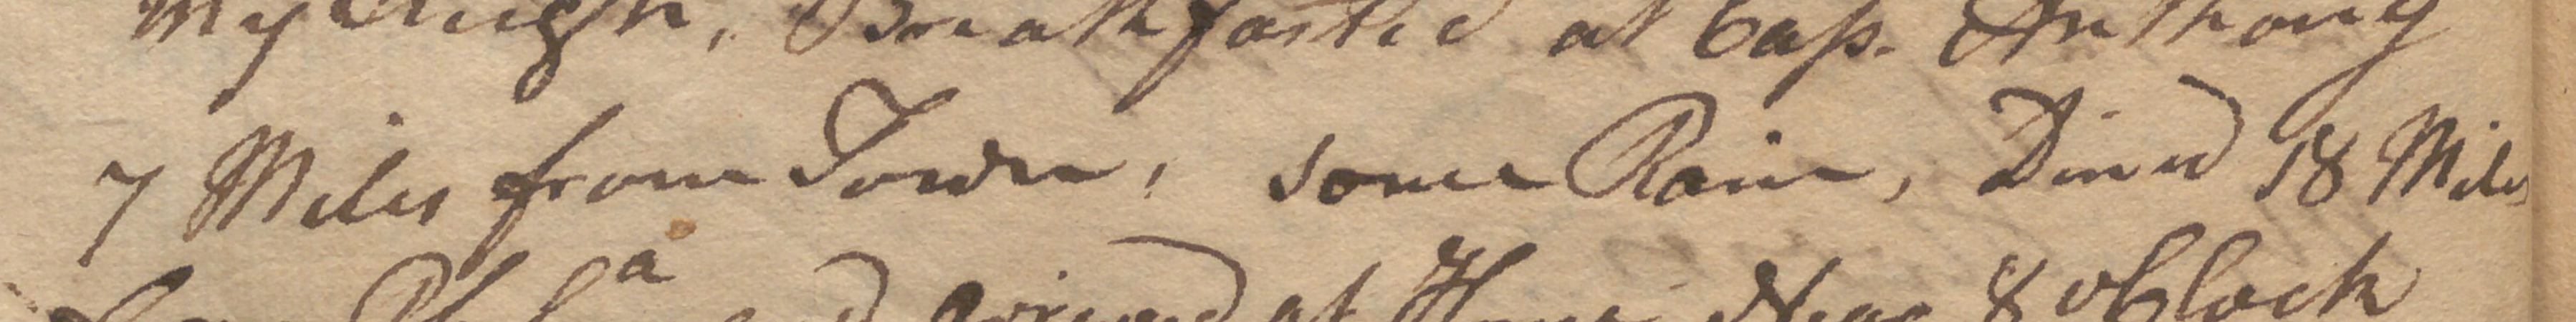7 Miles from Town, some Rain, Dined 18 Mile
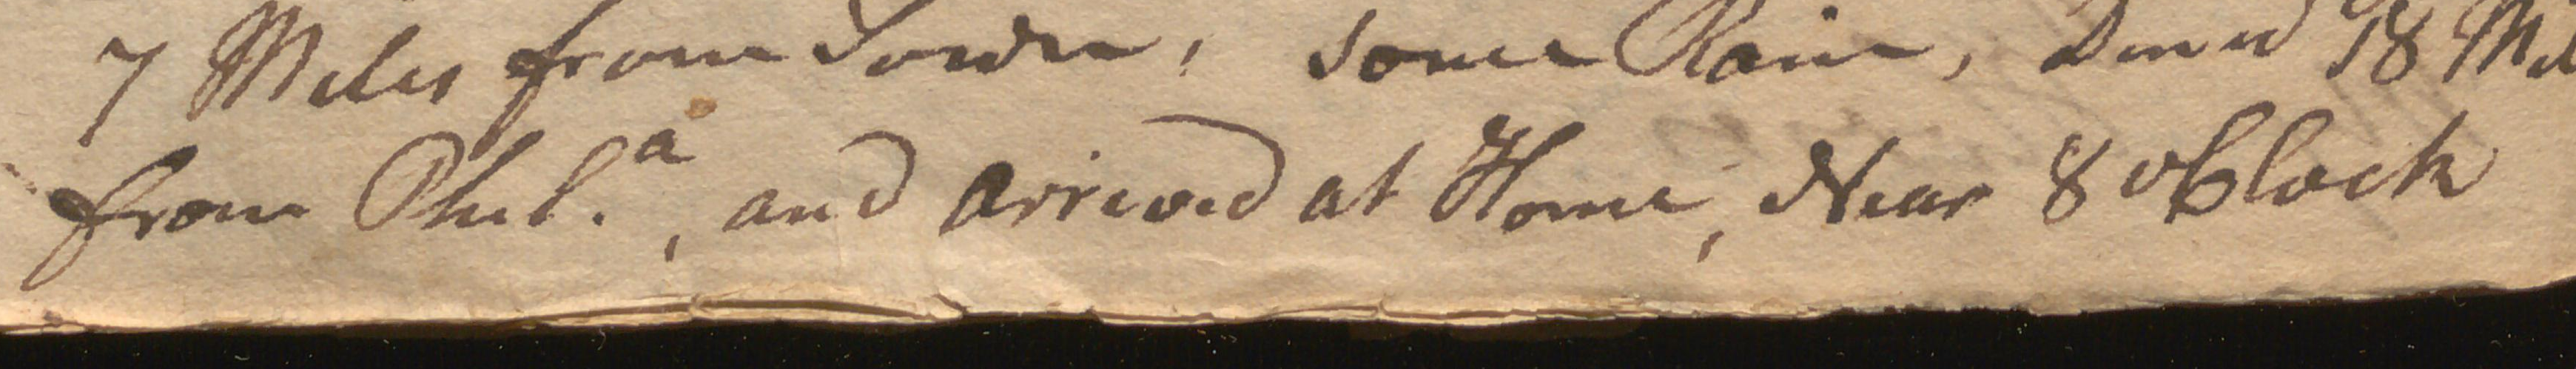from Phil^a. and arrived at Home, Near 8 oClock
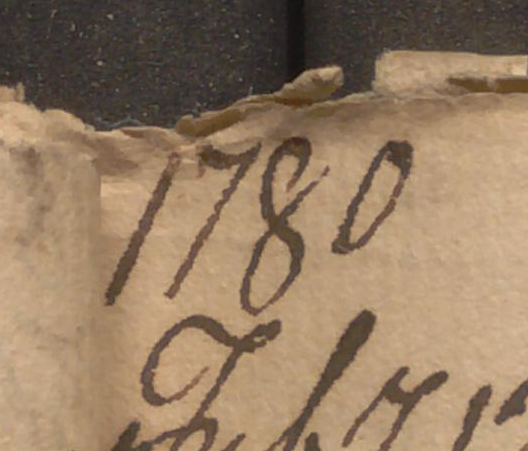1780
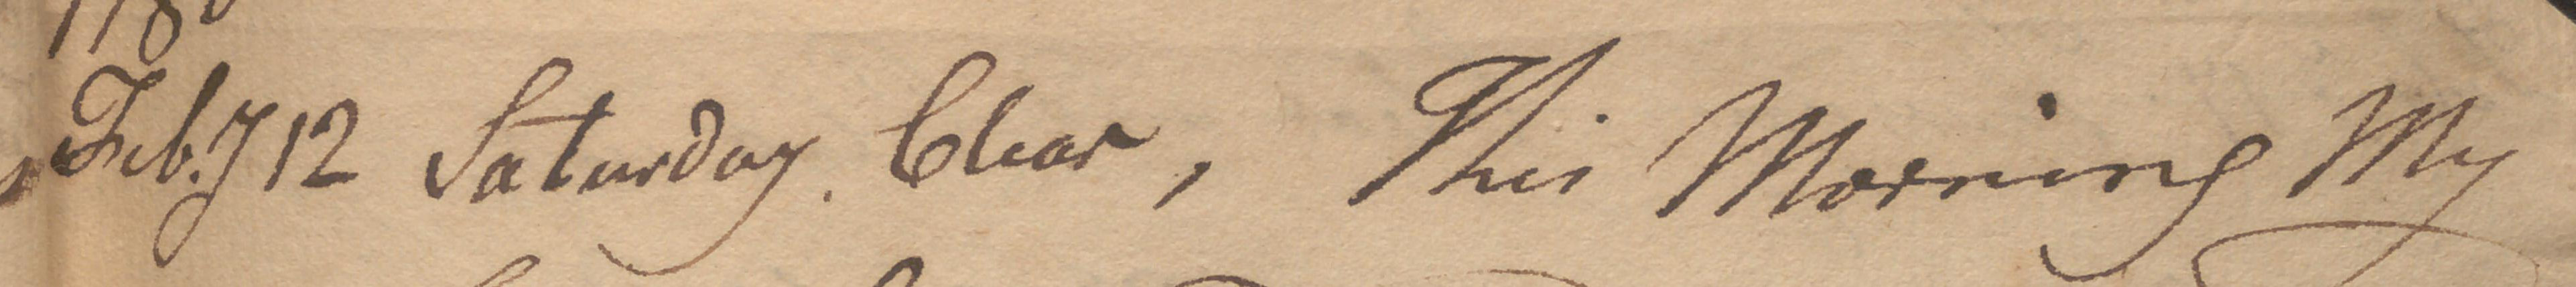Feb^y. 12 Saturday. Clear, This Morning My
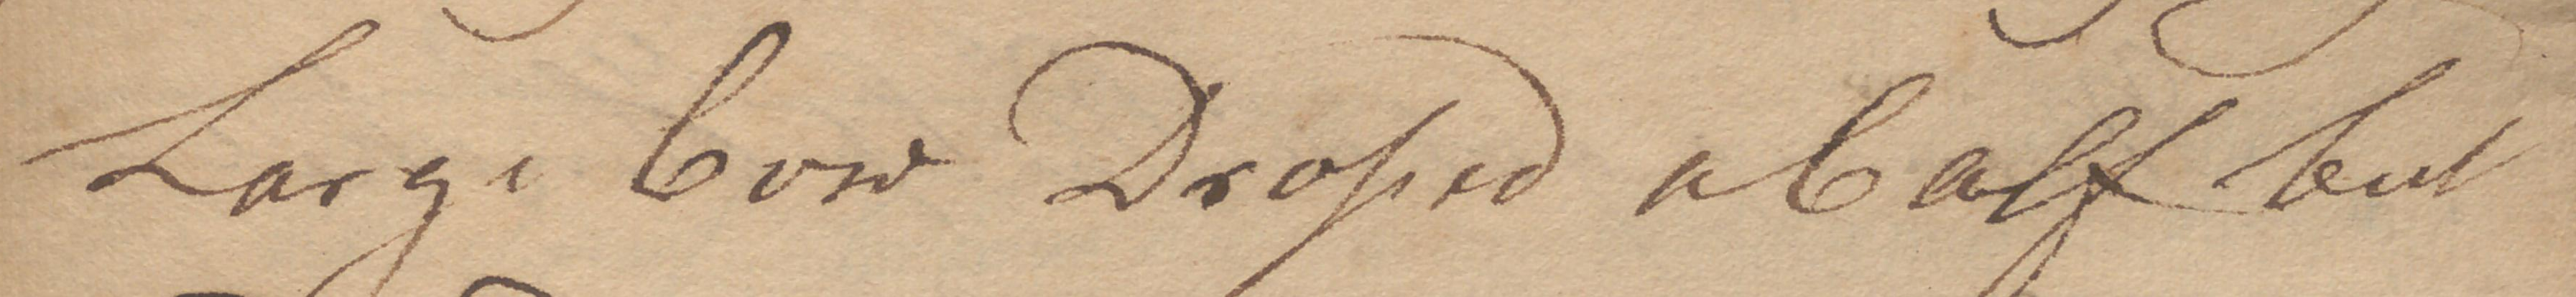Large Cow Droped a Calf but
